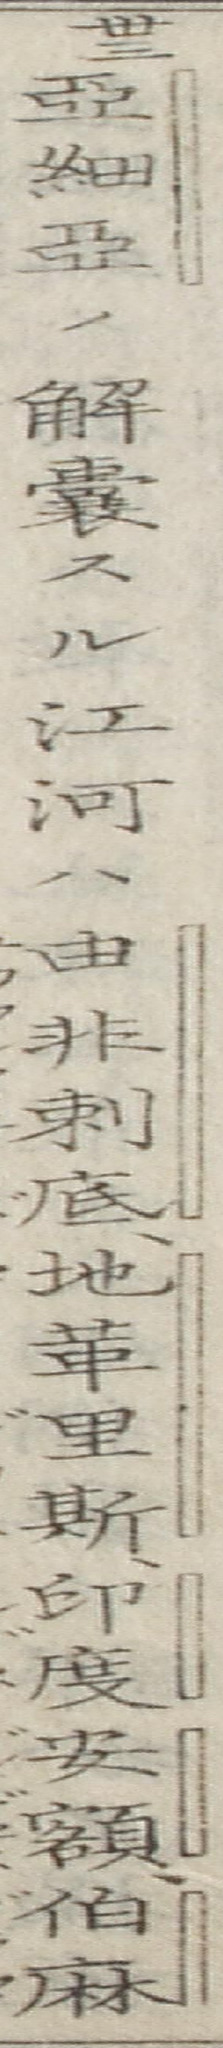丗三亜細亜ノ解囊スル江河ハ由非刺底、地革里斯、印度、安額、伯麻
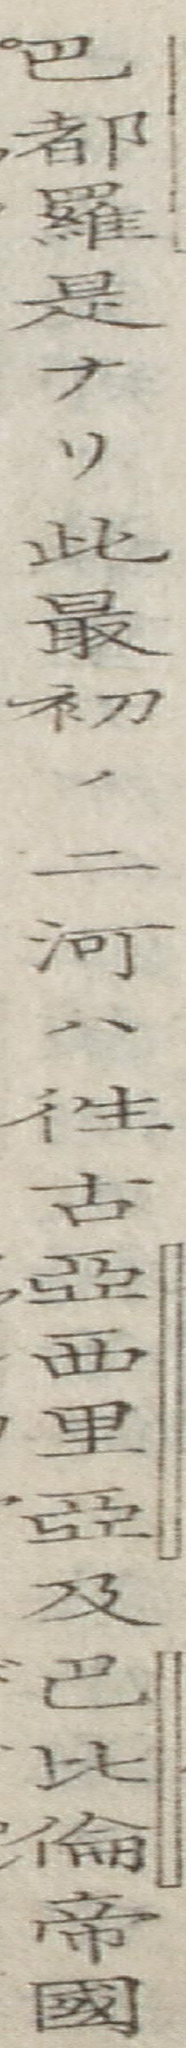巴都羅是ナリ此最初ノ二河ハ往古亜西里亜及巴比倫帝国
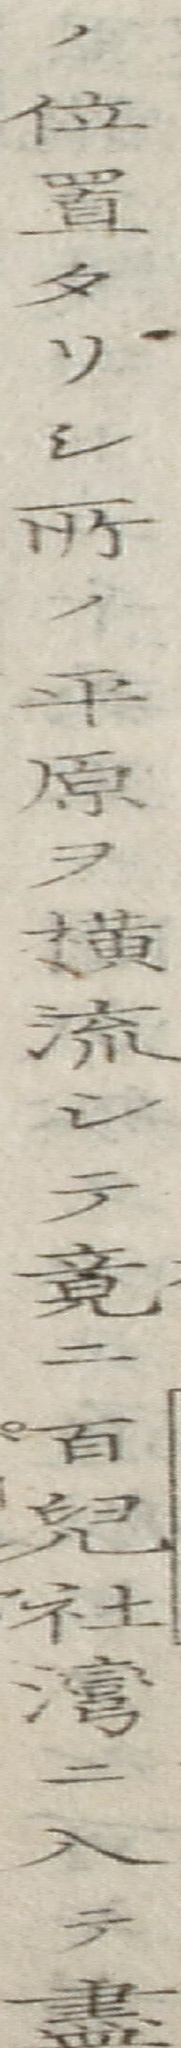ノ位置タリシ所ノ平原ヲ横流シテ竟ニ百児社湾ニ入テ尽
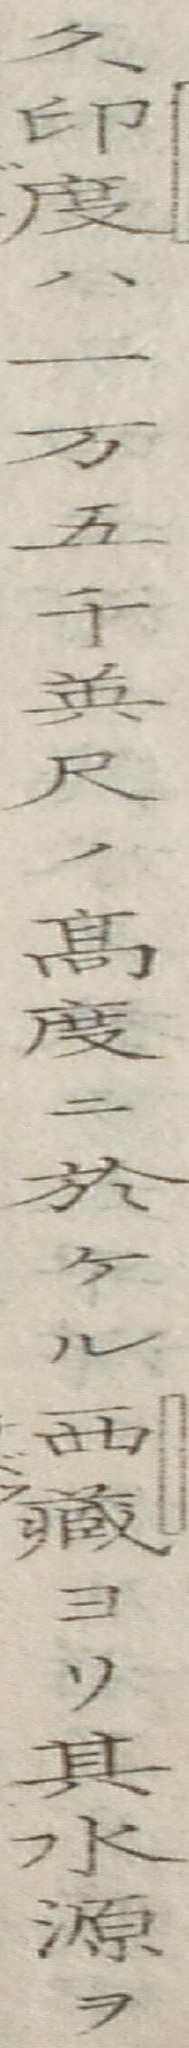ク、印度ハ一万五千英尺ノ高度ニ於ケル西蔵ヨリ其水源ヲ
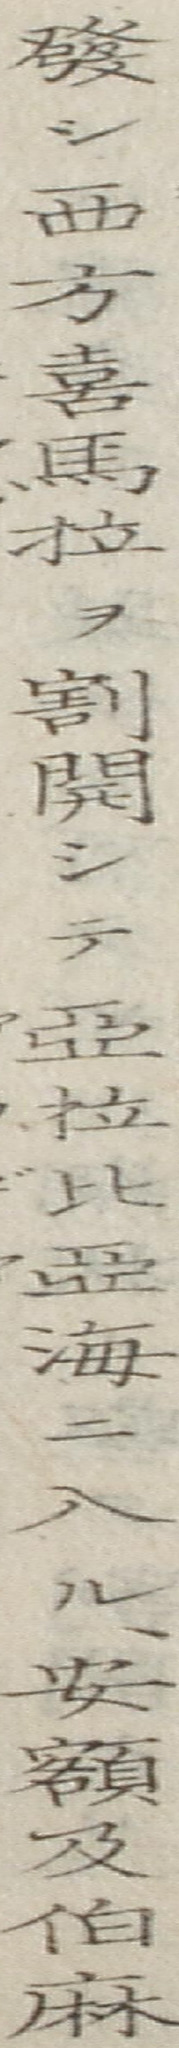発シ西方喜馬拉ヲ割開シテ亜拉比亜海ニ入ル、安額及伯麻
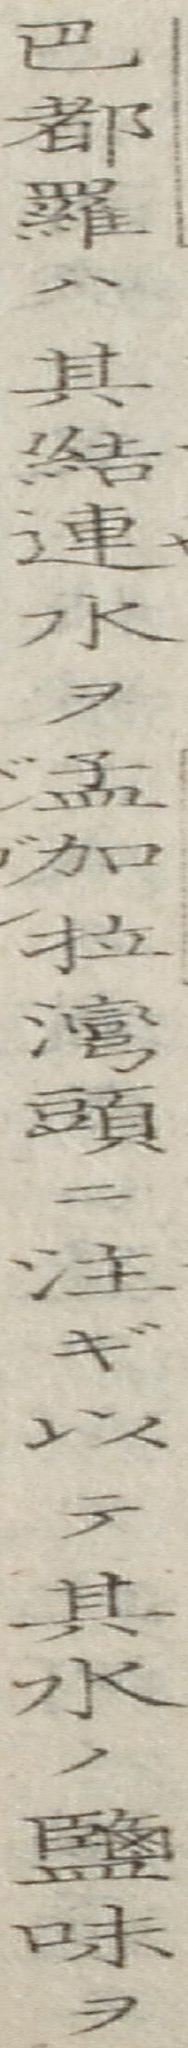巴都羅ハ其結連水ヲ孟加拉湾頭ニ注ギ以テ其水ノ塩味ヲ
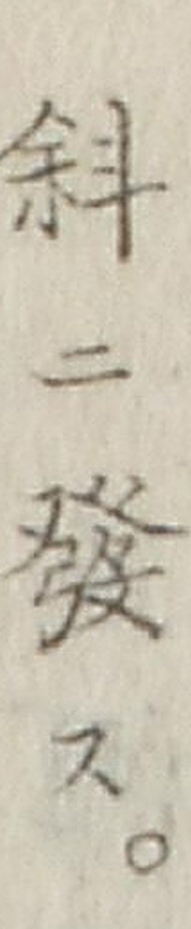斜ニ発ス。
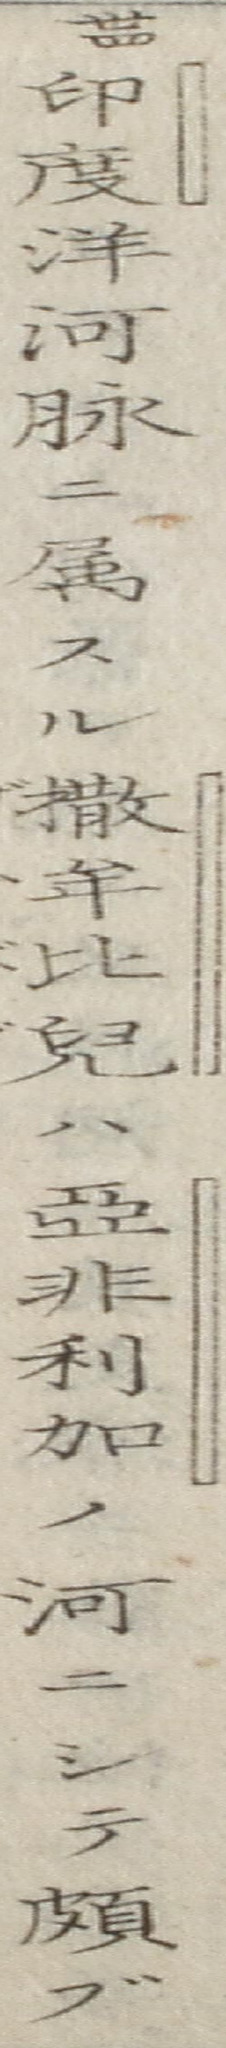丗四印度洋河脈ニ属スル撤牟比児ハ亜比利加ノ河ニシテ頗ブ
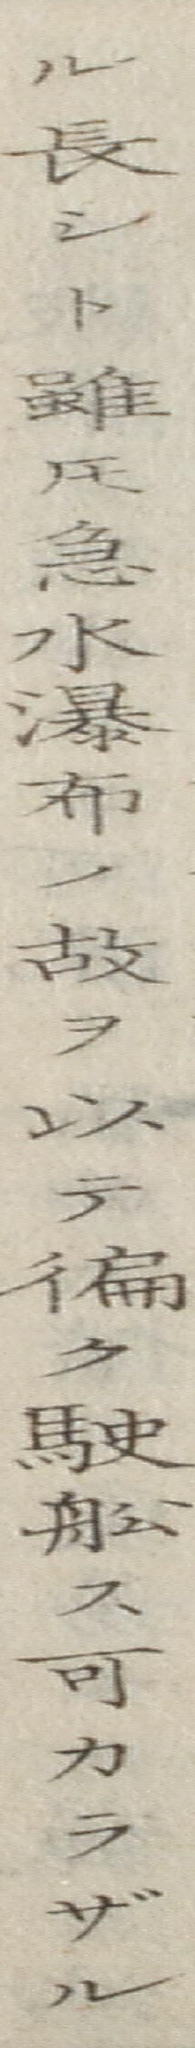ル長シト雖トモ急水瀑布ノ故ヲ以テ徧ク駛舩ス可カラザル
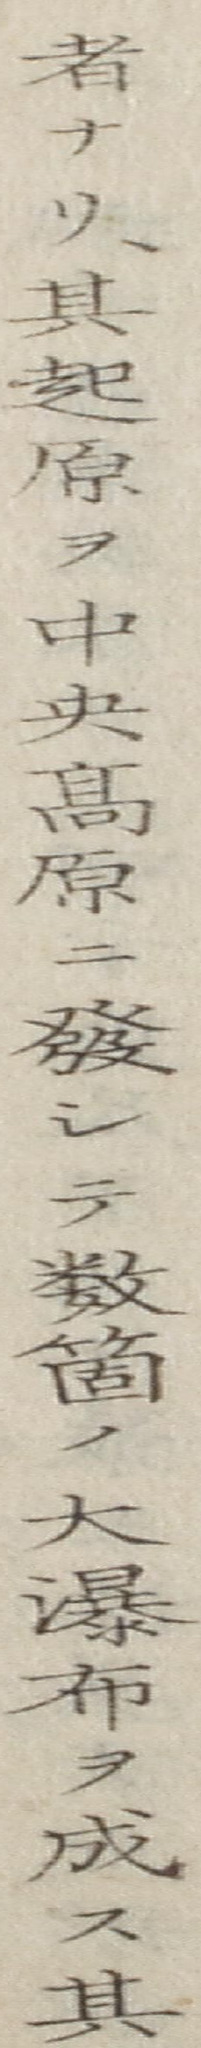者ナリ、其起原ヲ中央高原ニ発シテ数箇ノ大瀑布ヲ成ス其
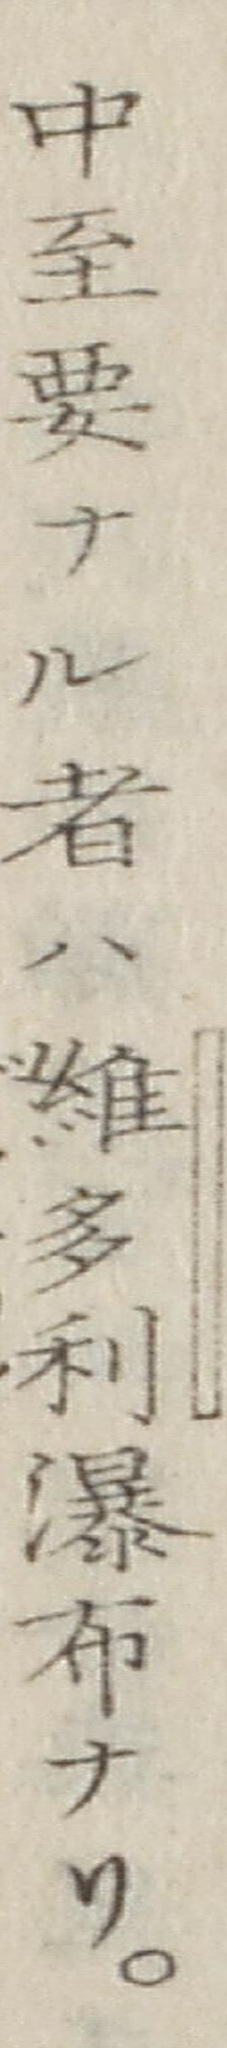中至要ナル者ハ維多利瀑布ナリ。
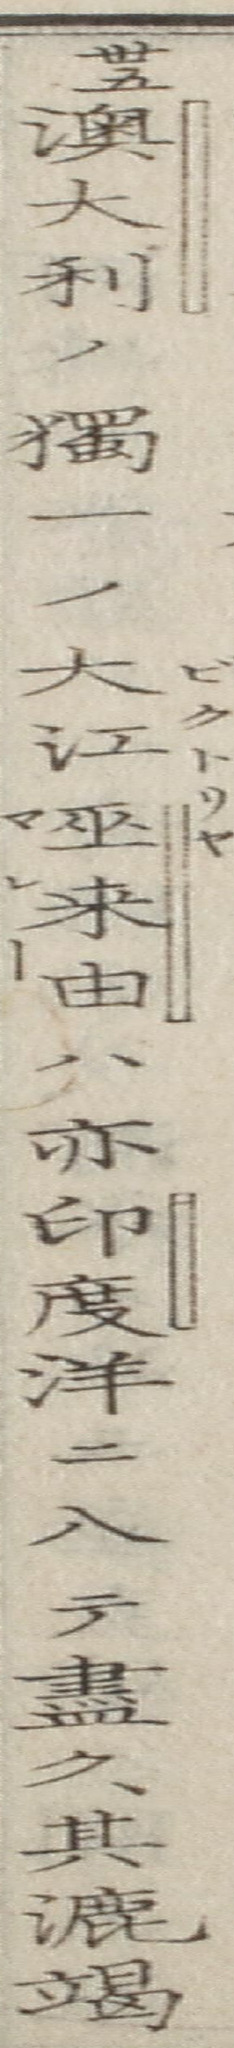丗五濠太利ノ独一ノ大江巫来由ハ亦印度洋ニ入テ尽ク、其濾竭
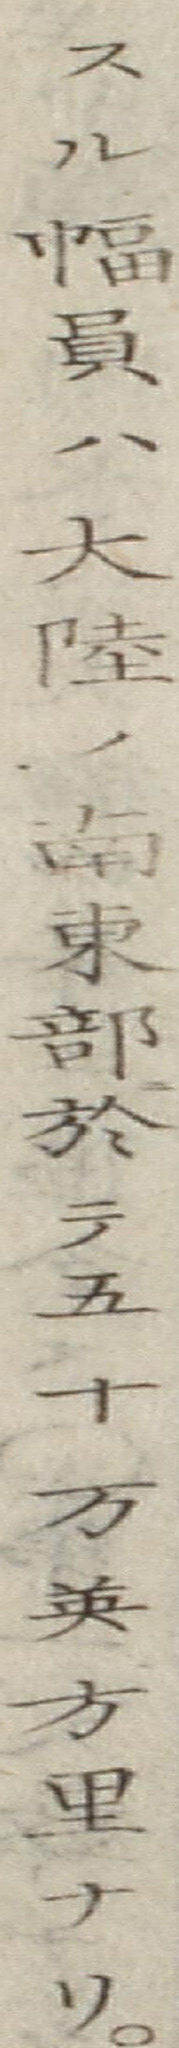スル幅員ハ大陸ノ南東部於テ五十万英方里ナリ。
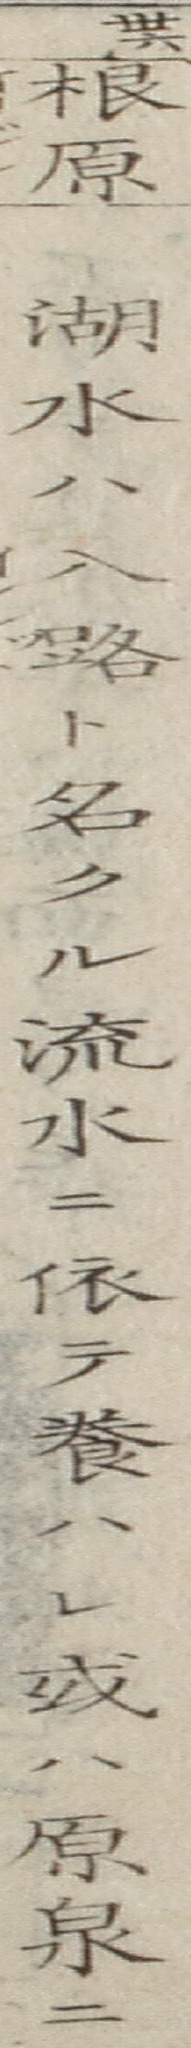丗六〔根原〕湖水ハ入路ト名クル流水ニ依テ養ハレ或ハ原泉ニ
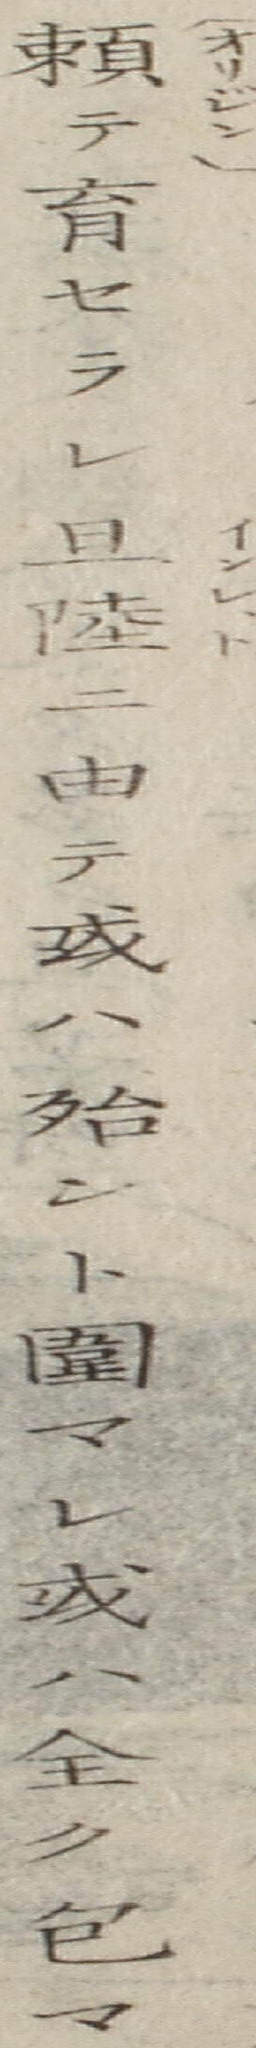頼テ育セラレ且陸ニ由テ或ハ殆ント囲マレ或ハ全ク包マ
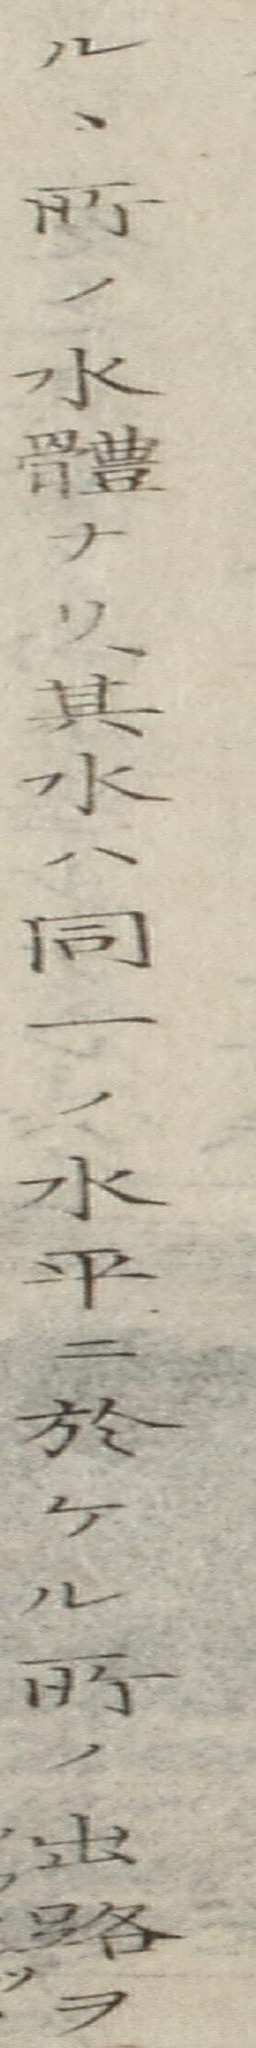ルヽ所ノ水体ナリ、其水ハ同一ノ水平ニ於ケル所ノ出路ヲ
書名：地形論　巻二
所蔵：東京大学地震研究所図書室 Earthquake Research Institute Library, The University of Tokyo, JAPAN
